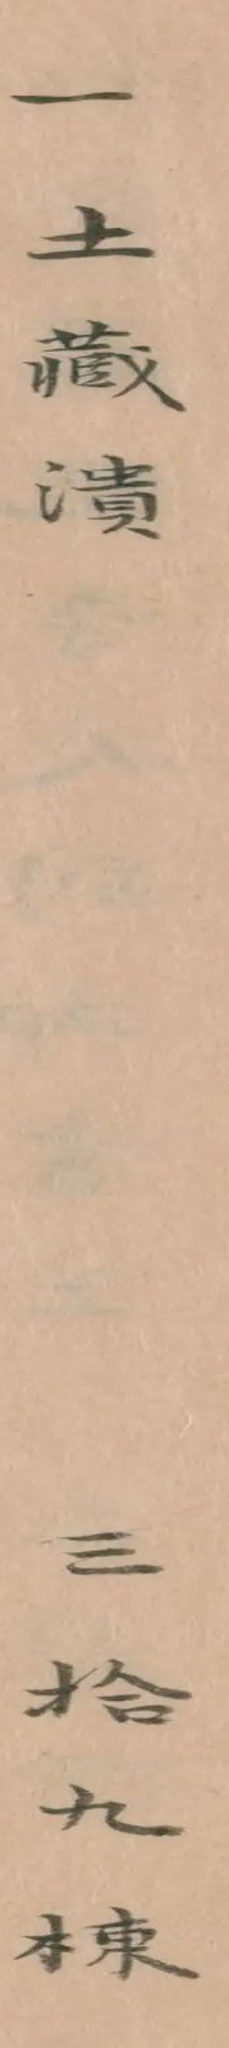一土藏潰三拾九棟
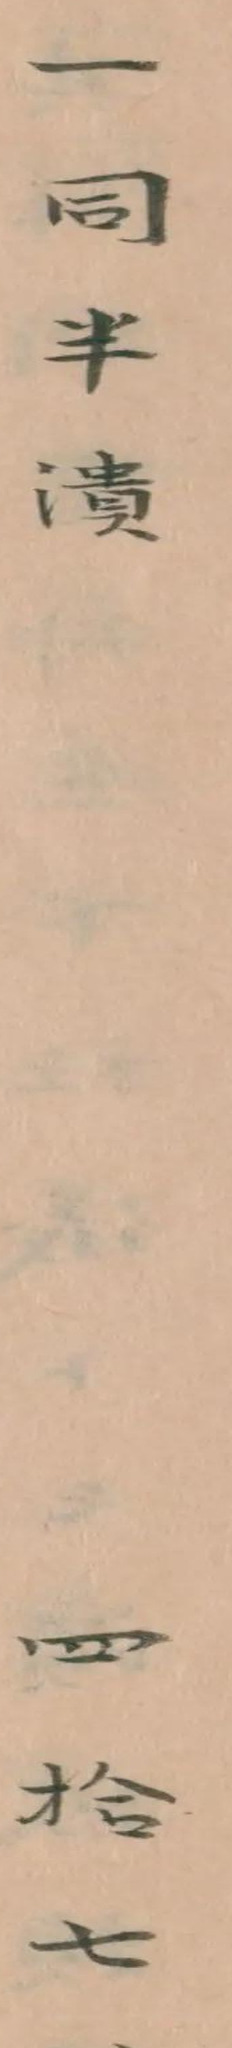一同半潰四拾七棟
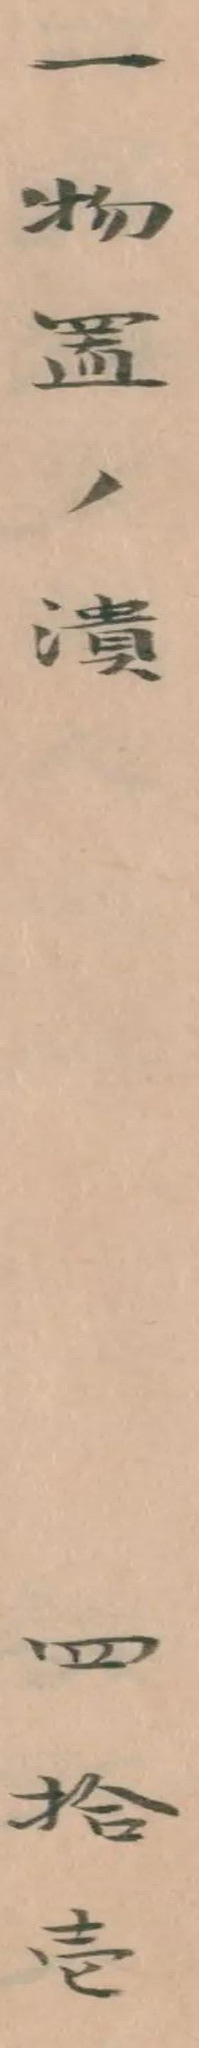一物置ノ潰四拾壱棟
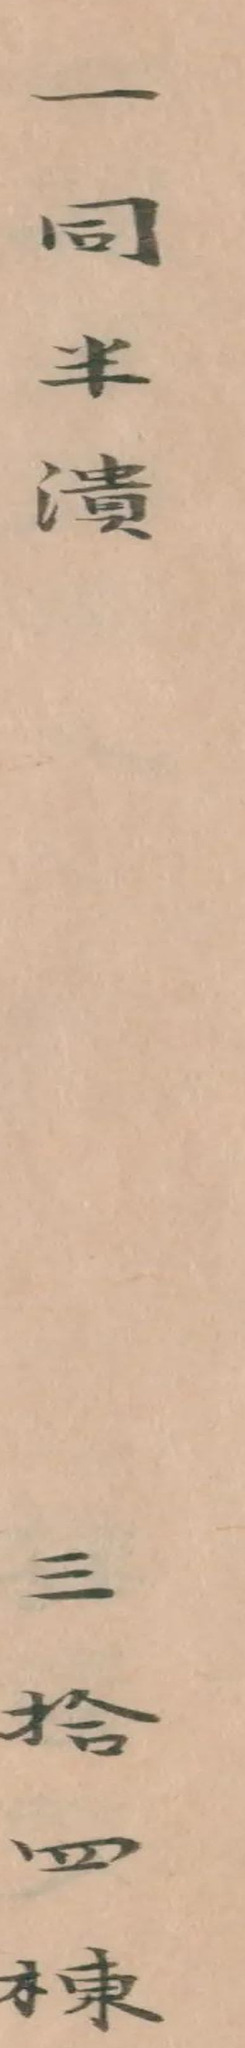一同半潰三拾四棟
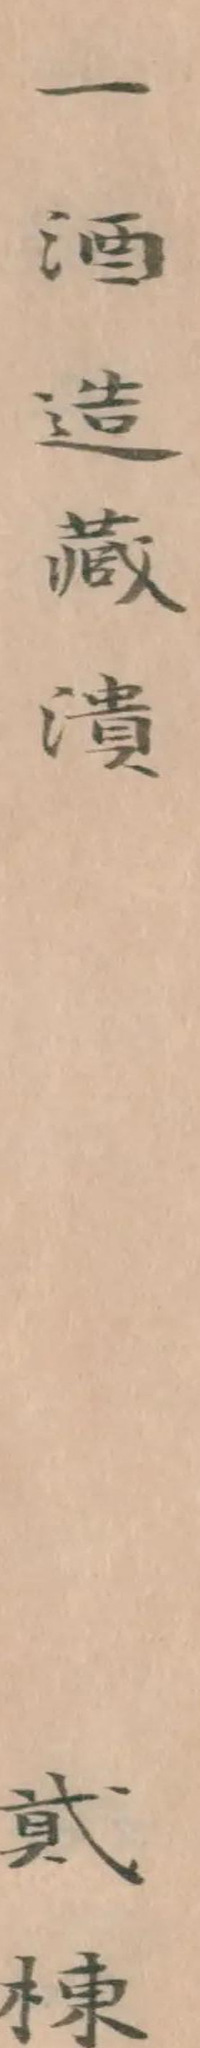一酒造藏潰貮棟

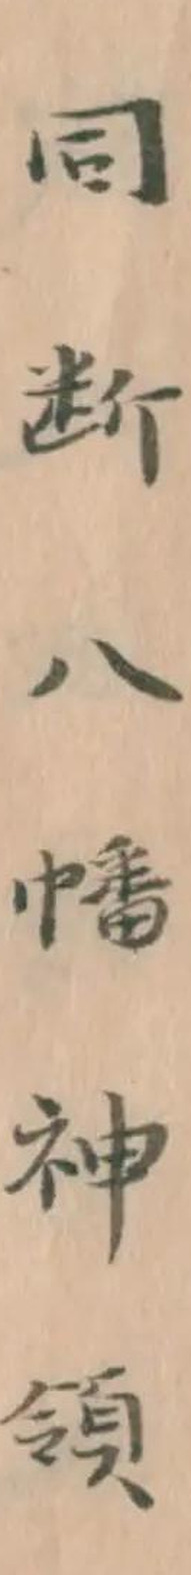同断八幡神領
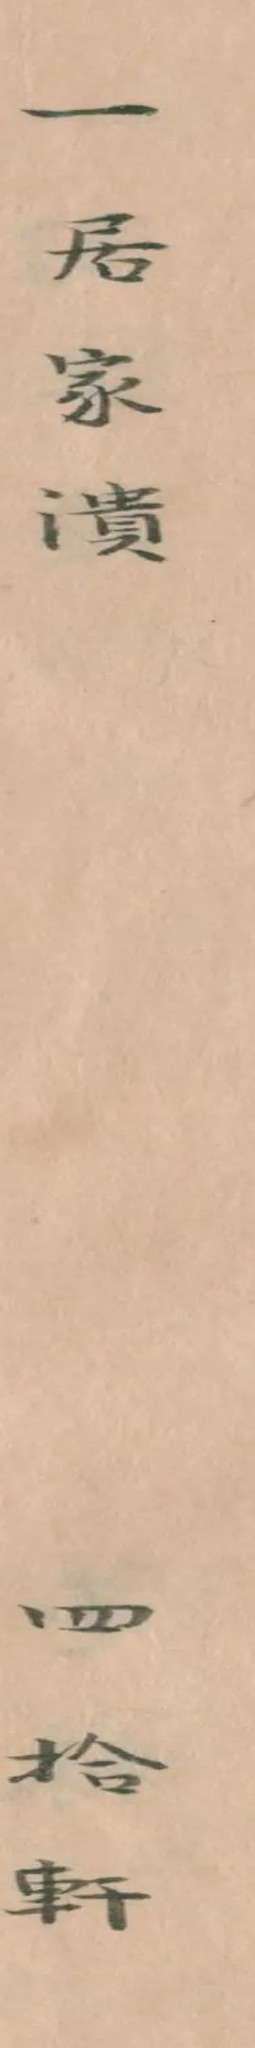一居家潰四拾軒
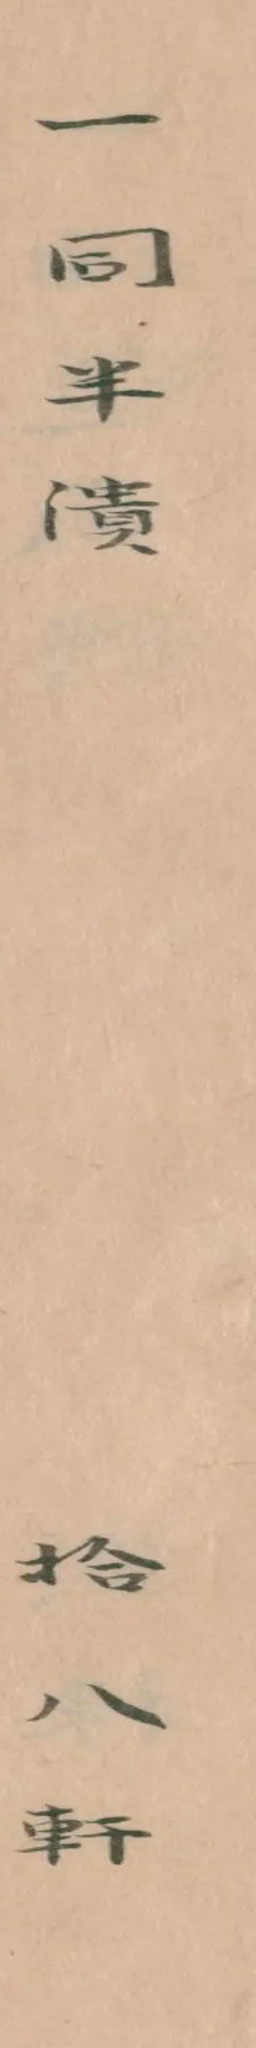一同半潰拾八軒
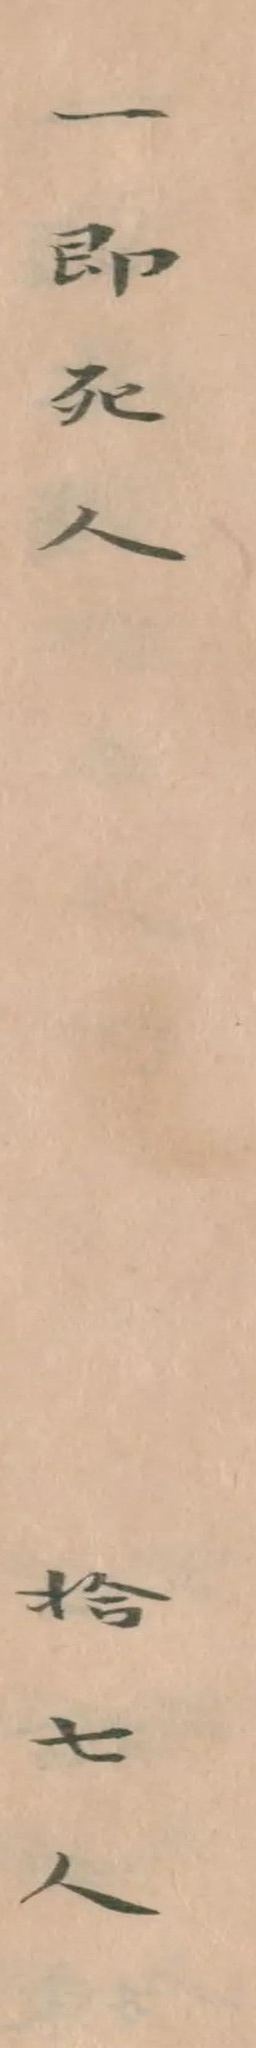一即死人拾七人
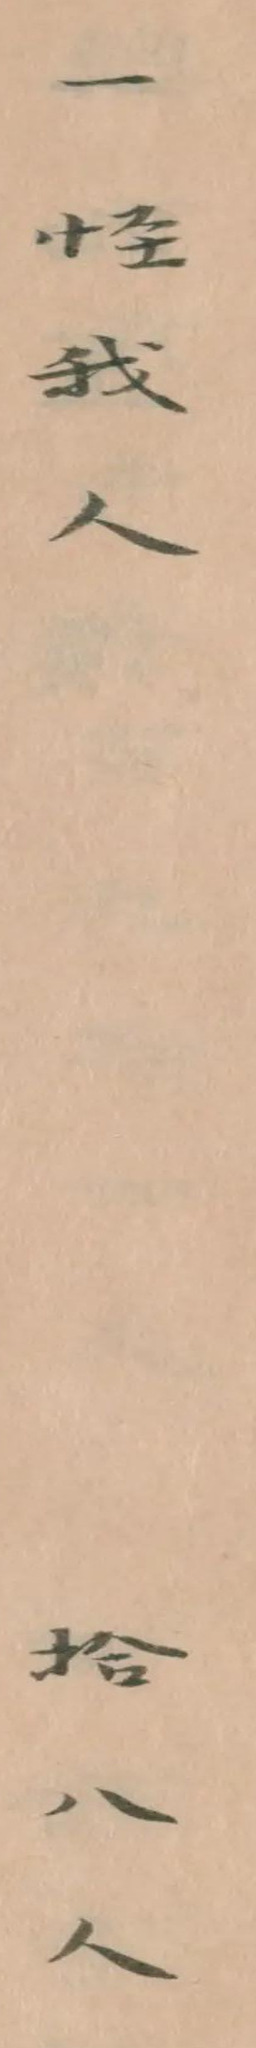一怪我人拾八人
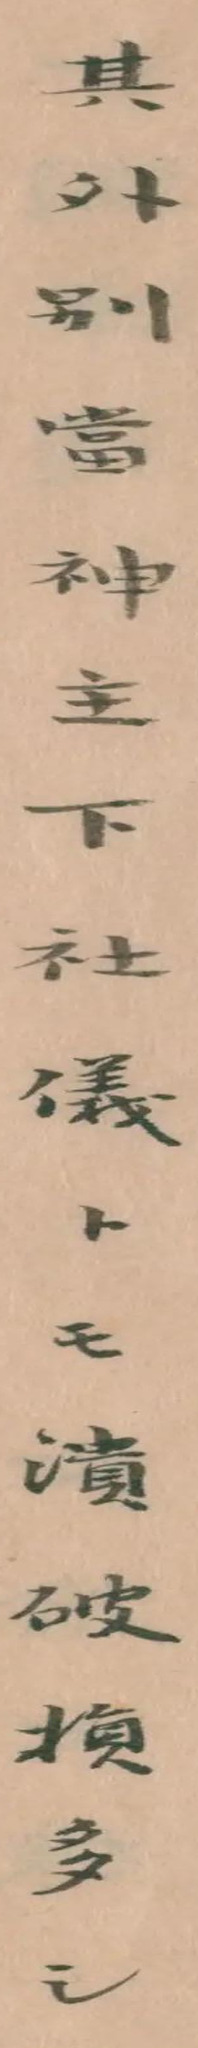其外別当神主下社儀トモ潰破損多シ
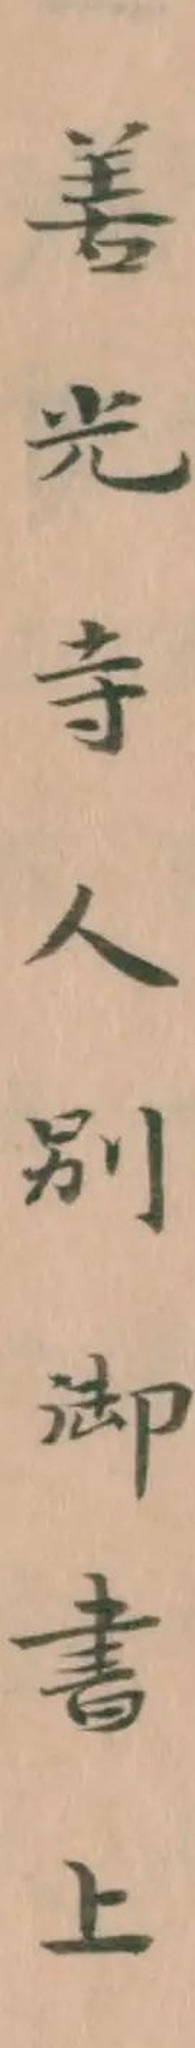善光寺人別御書上
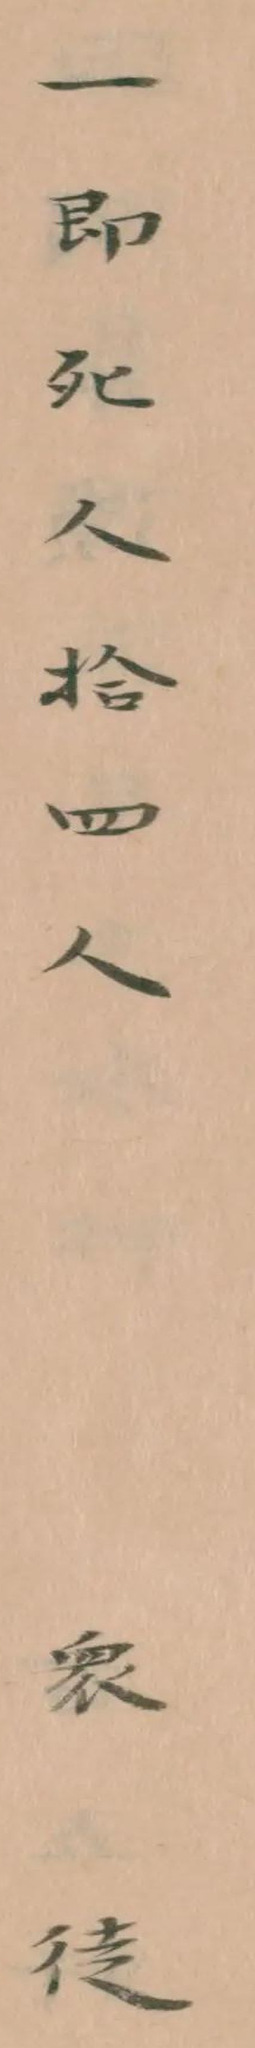一即死人拾四人衆徒
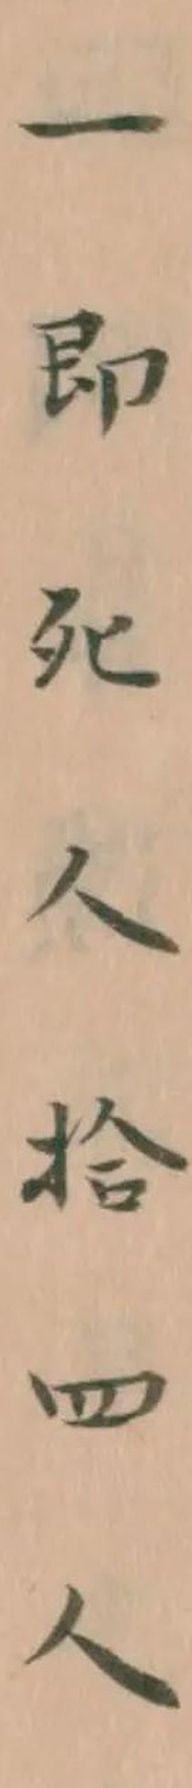一即死人拾七人
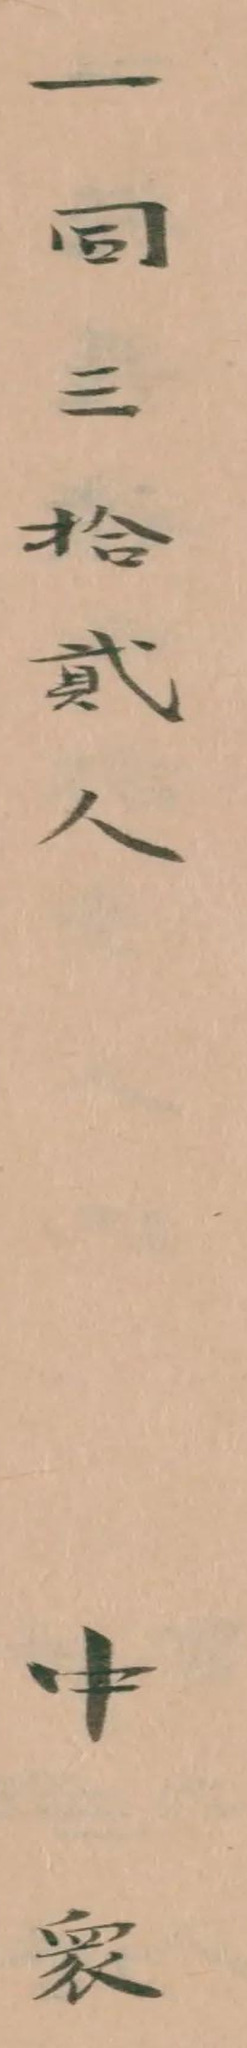一同三拾貮人中衆
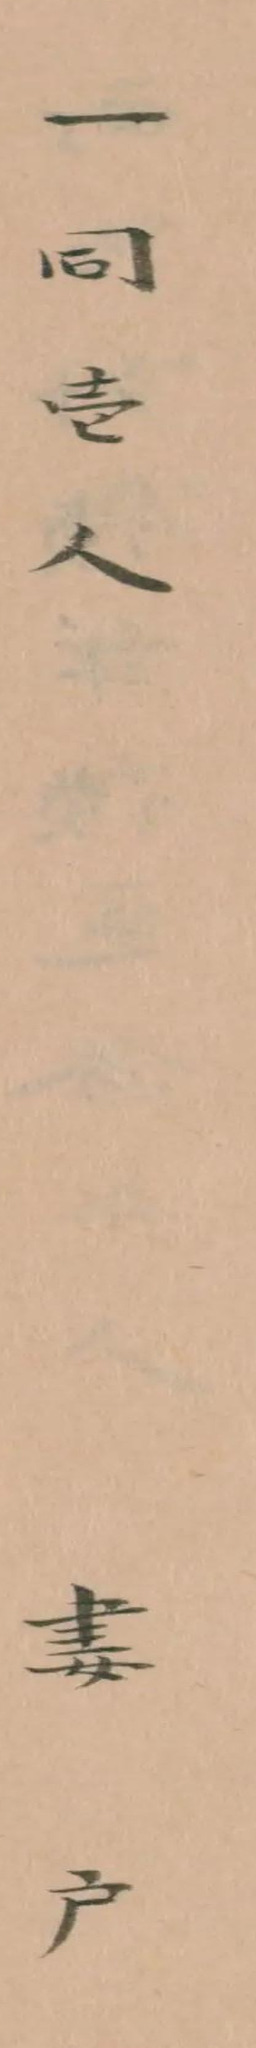一同壱人妻戸
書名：地災撮要. 巻5-6(地震之部)
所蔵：国立国会図書館 National Diet Library, JAPAN
